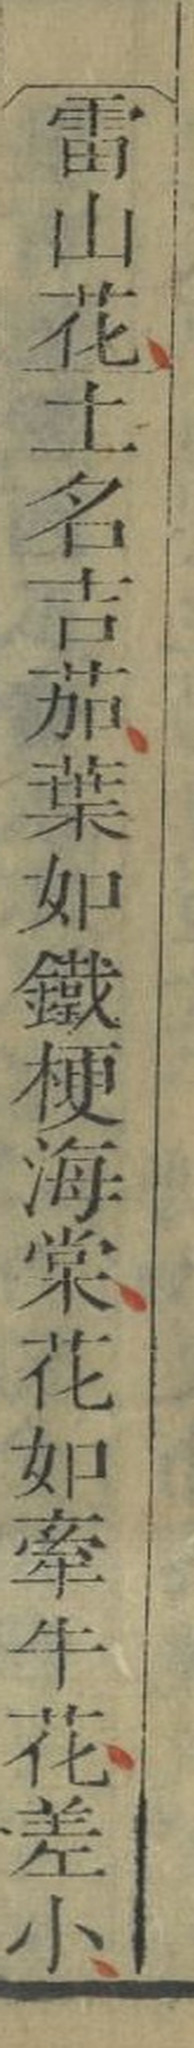[雷山花]土名吉茄葉如鉄梗海棠花如牽牛花差小
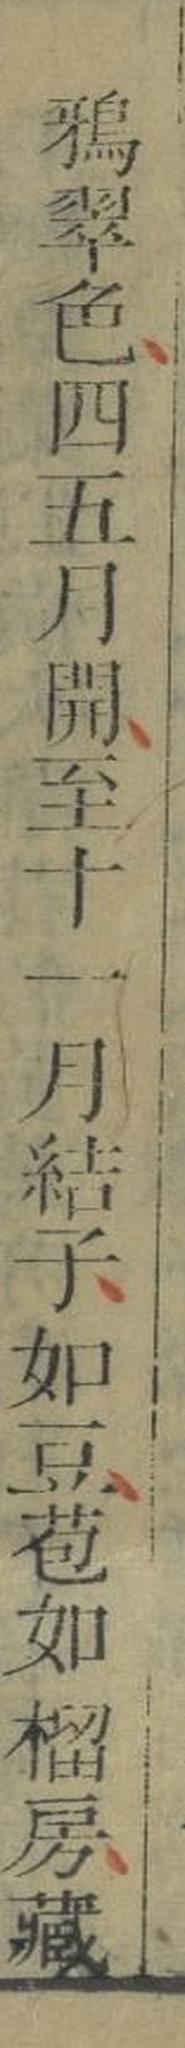鴉翠色四五月開至十一月結子如豆苞如榴房蔵
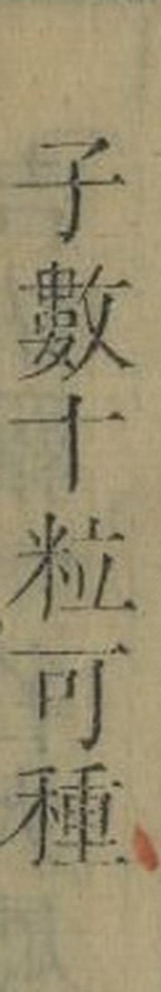子数十粒可種

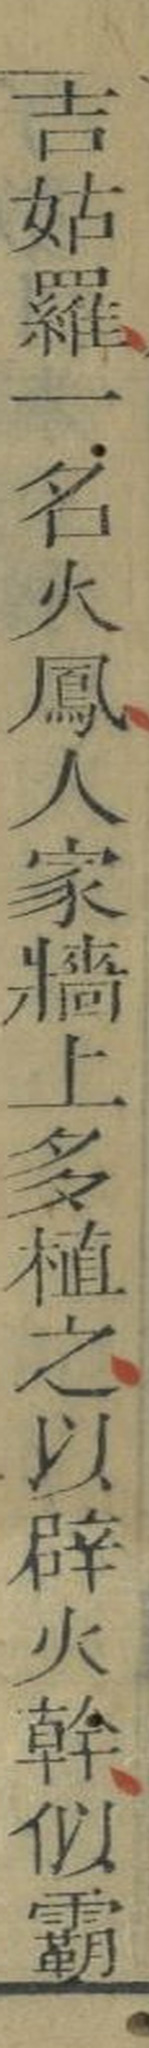[吉姑羅]一名火鳳人家牆上多植之以辟火幹似覇
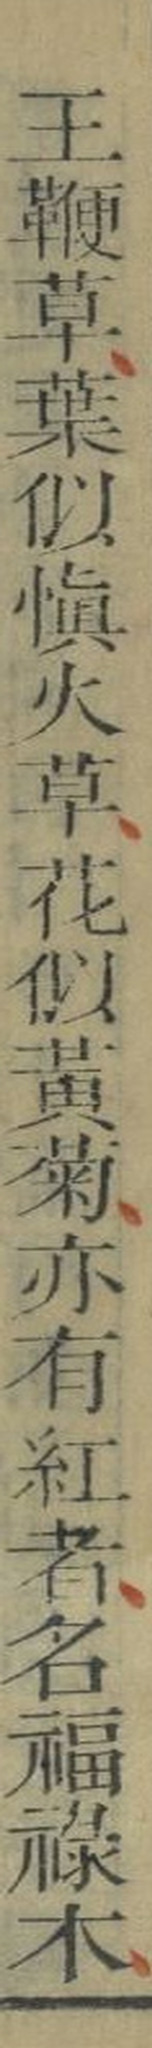王鞭草葉似慎火草花似黄菊亦有紅者名福禄木
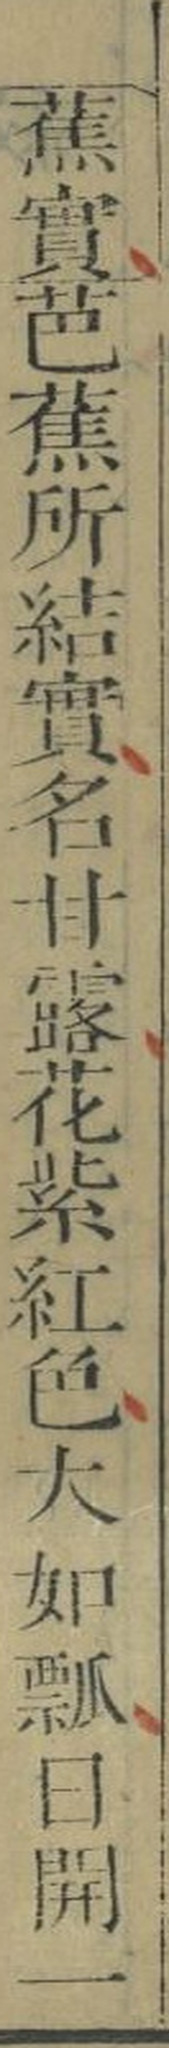[蕉実]芭蕉所結実名甘露花紫紅色大如瓢日開一
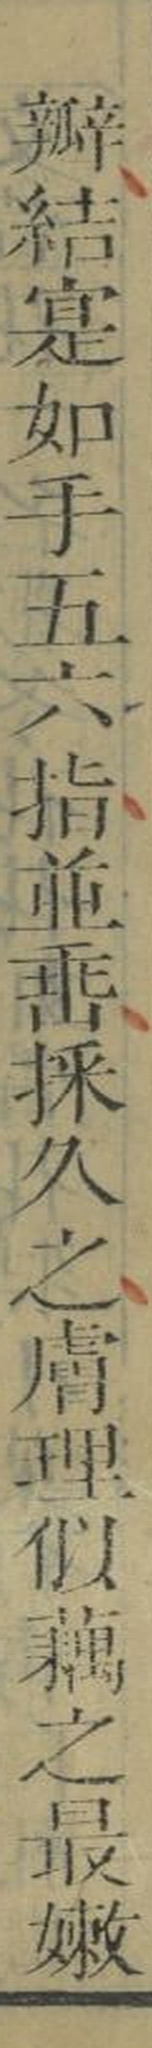弁結寔如手五六指並垂採久之膚理似藕之最嫩
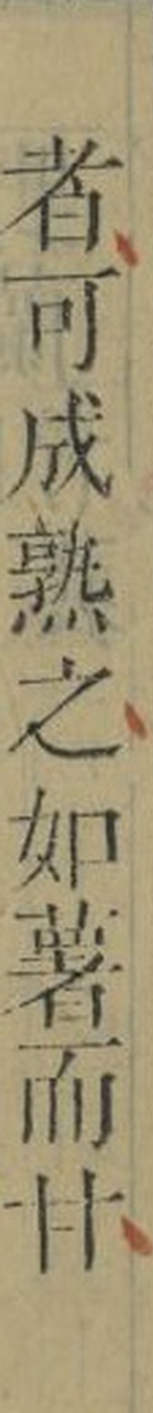者可成熟之如薯而甘
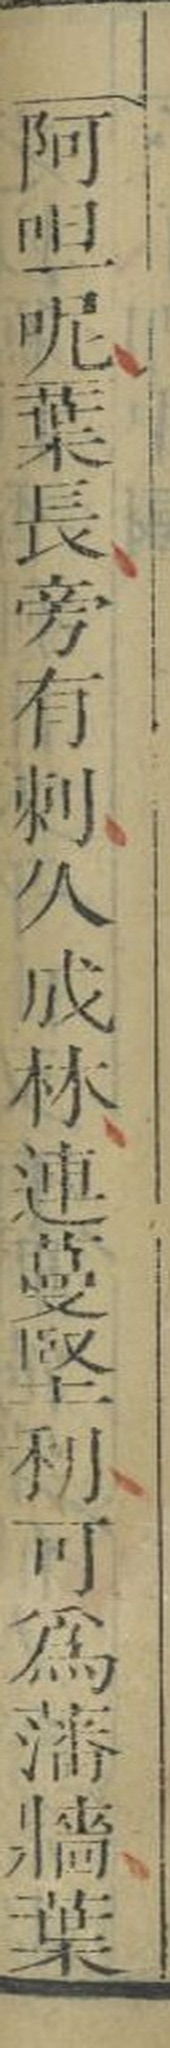[阿呾呢]葉長旁有刺久成林連蔓堅利可為藩牆葉
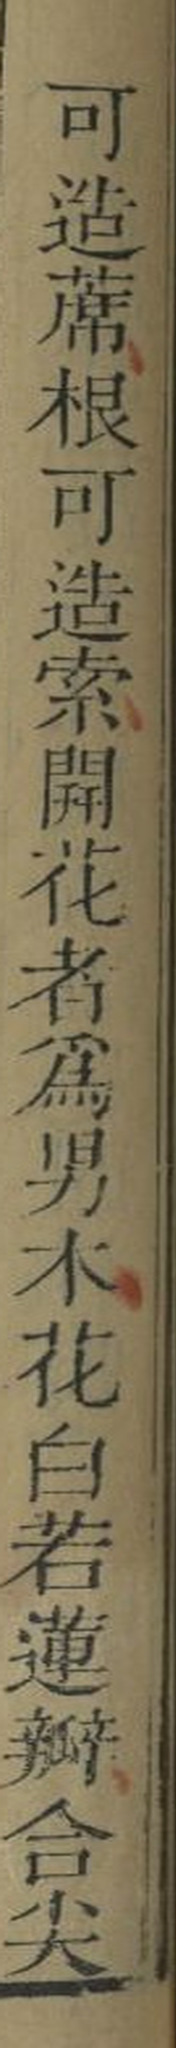可造蓆根可造索開花者為男木花白若蓮弁合尖
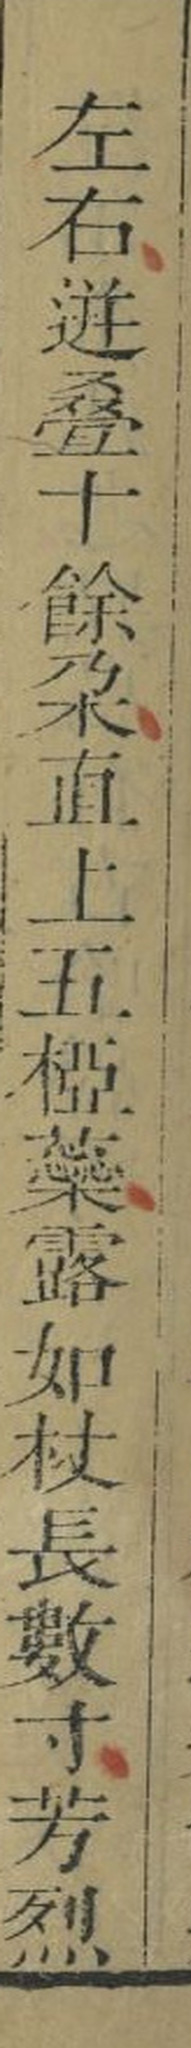左右迸叠十与朶直上五椏蘂露如杖長数寸芳烈
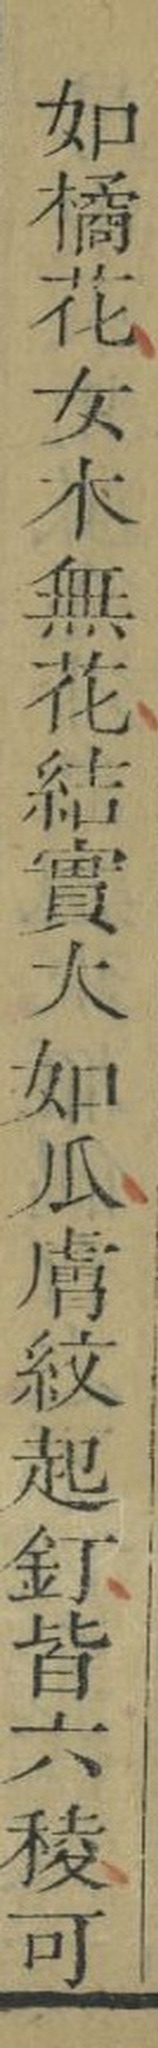如橘花女木無花結実大如瓜膚紋起釘皆六稜可
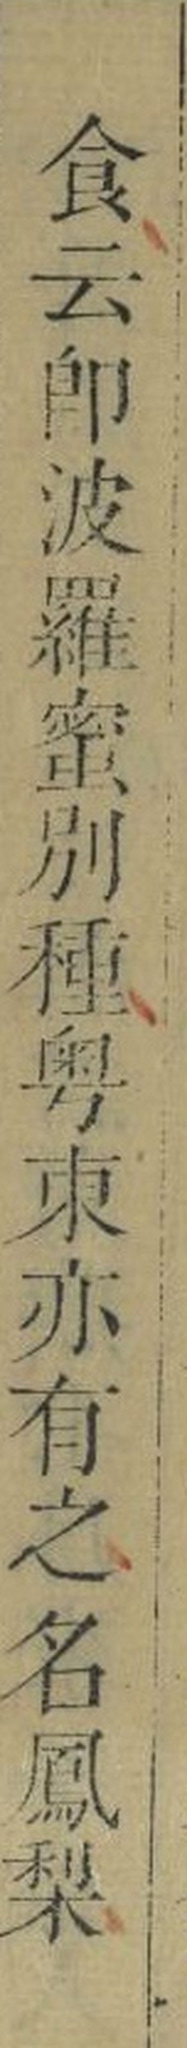食云即波羅蜜別種粤東亦有之名鳳梨
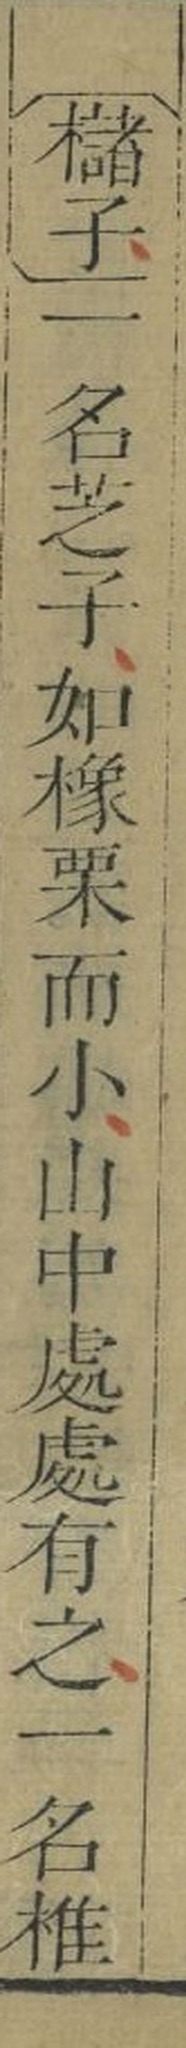[櫧子]一名芝子如橡栗而小山中処処有之一名椎
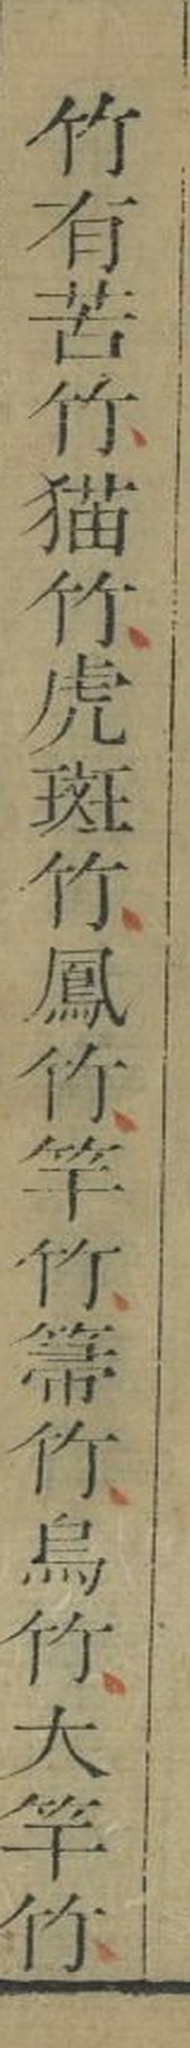竹有苦竹猫竹虎斑竹鳳竹竿竹箒竹烏竹大竿竹
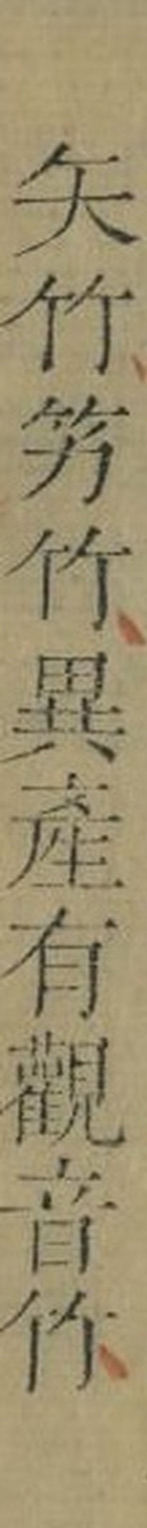矢竹竻竹異産有観音竹
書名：中山伝信録 巻六
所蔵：University of the Ryukyus Library
